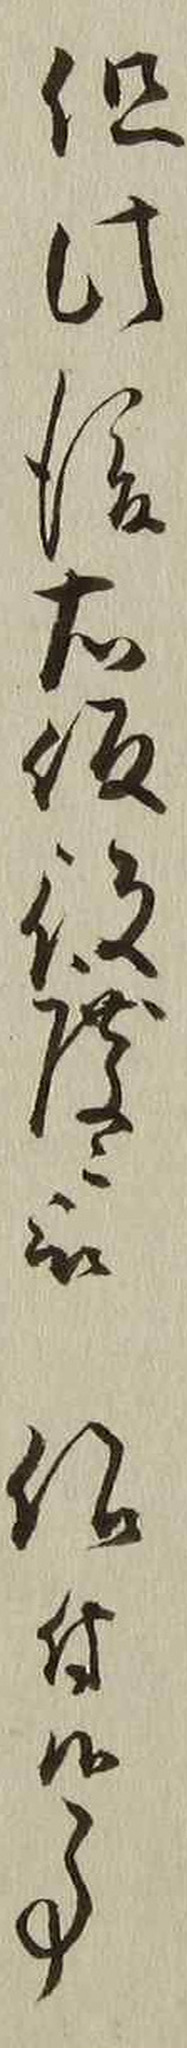但此後右仮役度ニ被仰付候事
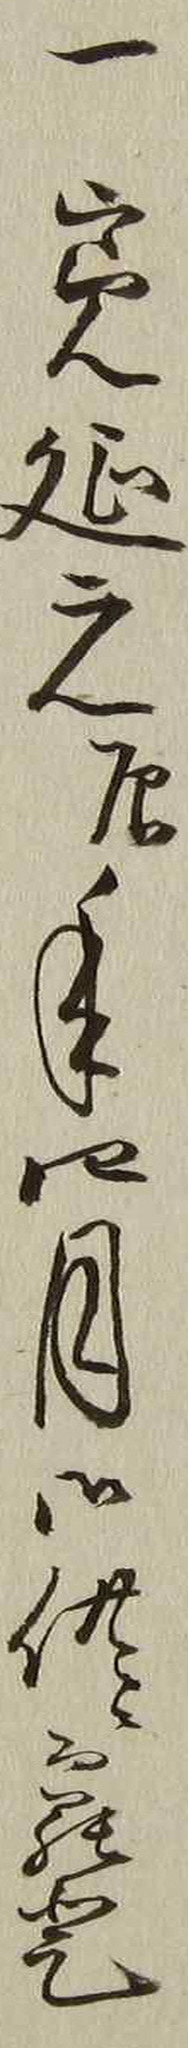一寛延元辰年四月御供ニ而罷登
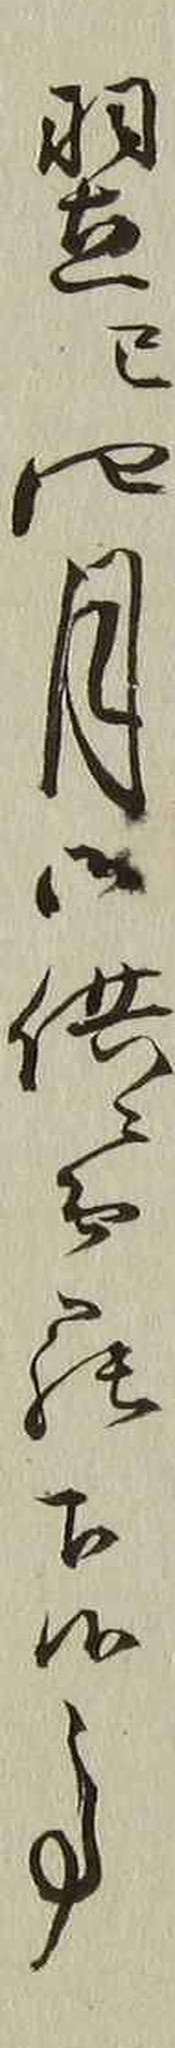翌巳四月御供ニ而罷下候事
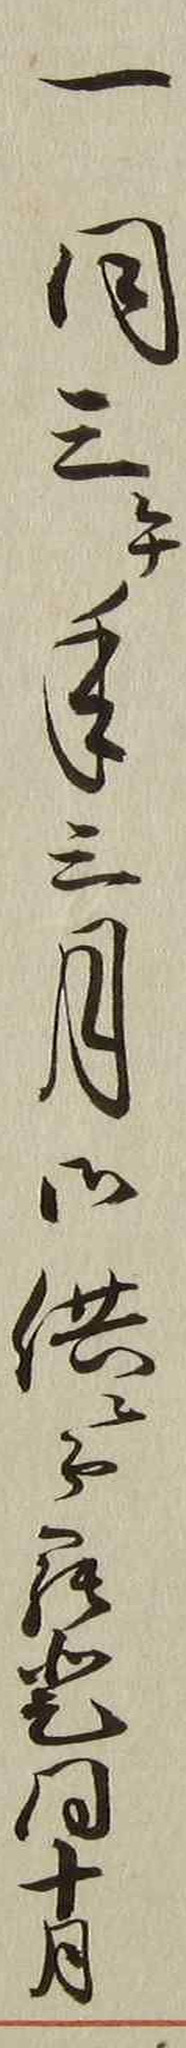一同三午年三月御供ニ而罷登同十月
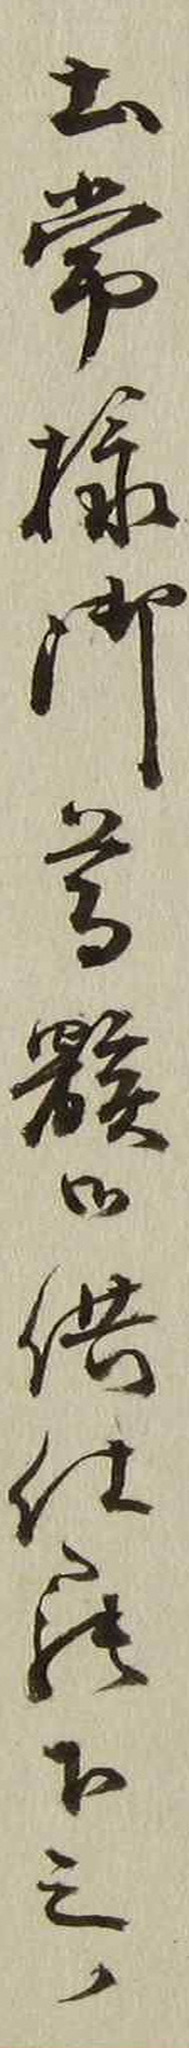土常様御尊骸御供罷下三ノ
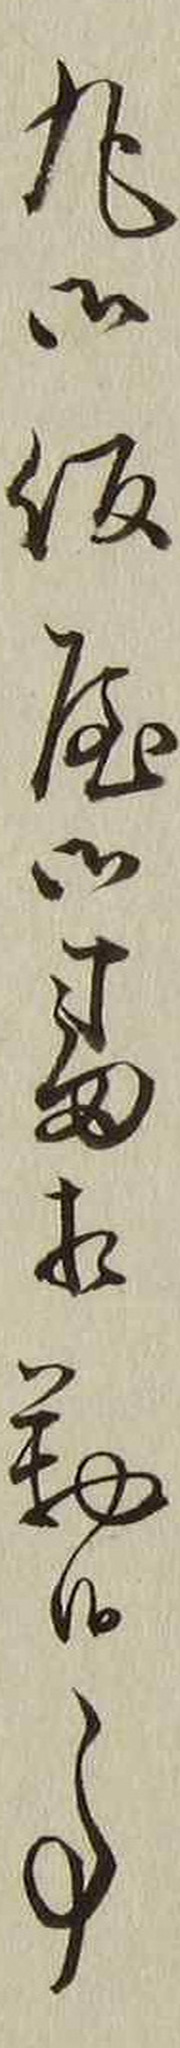丸御仮屋御番相勤候事
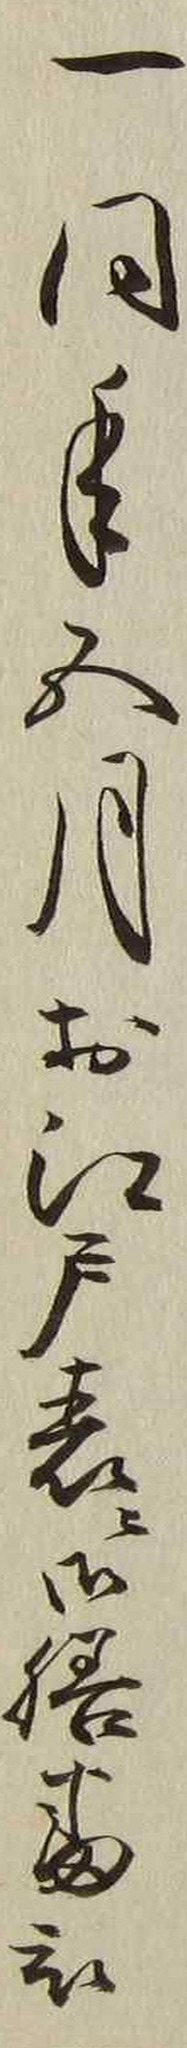一同年五月於江戸表ニ御膳番被
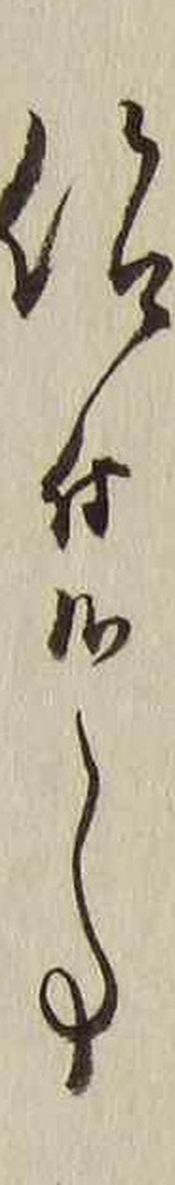仰付候事
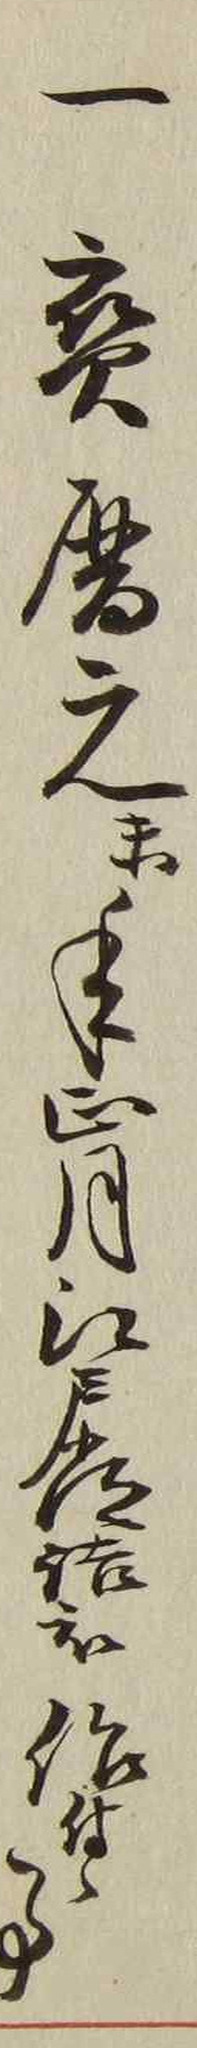一宝暦元未年正月江戸常詰被仰付候事

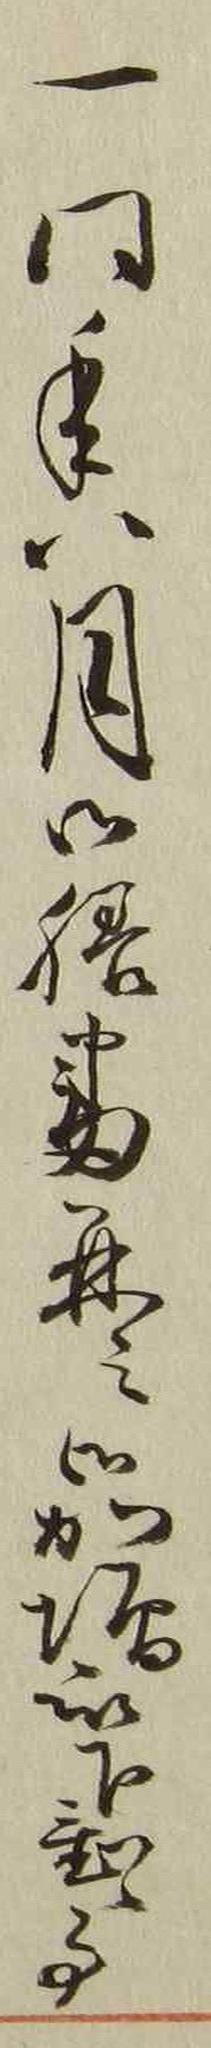一同年八月御膳番再之御加増被下置候事
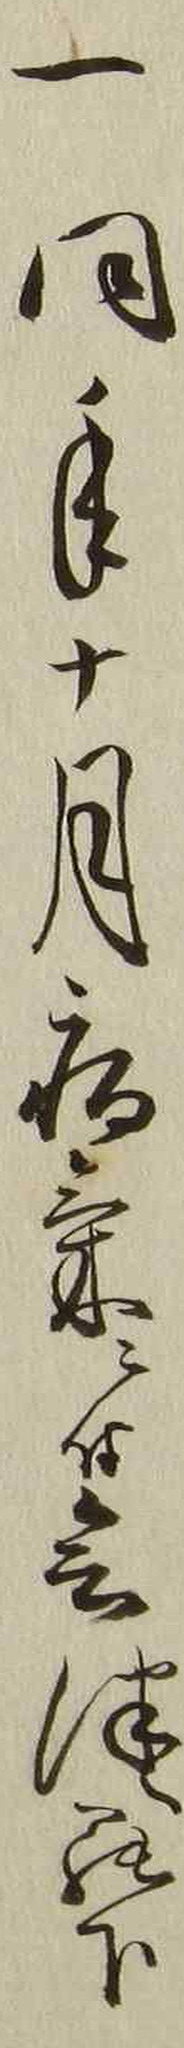一同月十月病気ニ付会津へ罷下
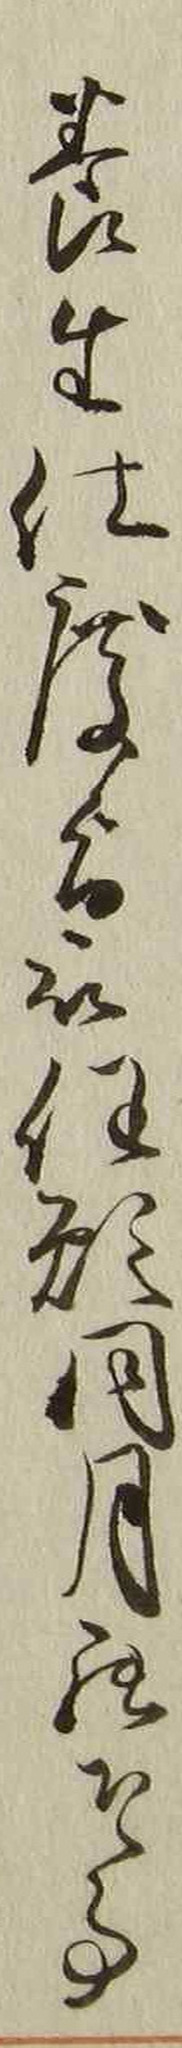養生仕度旨被任願同月罷下候事
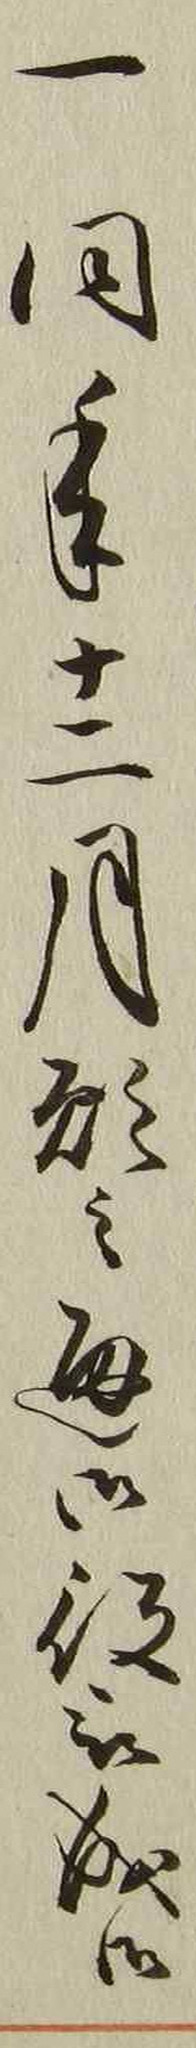一同年十二月願之通御役被成御
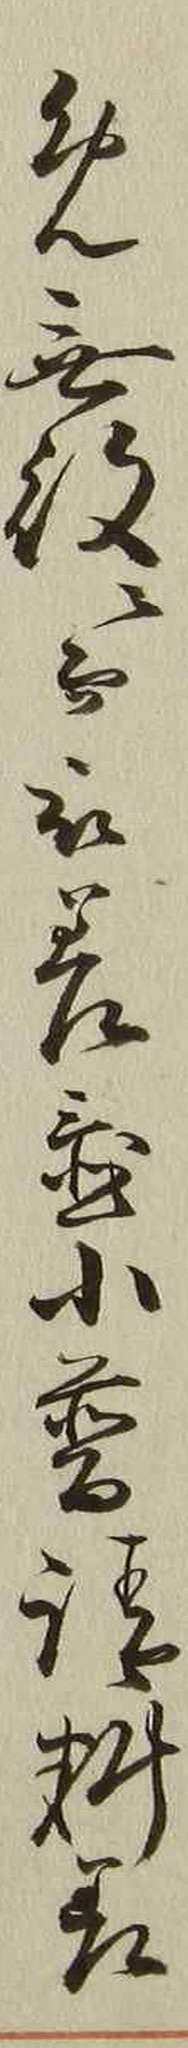免無役ニ而被差置小普請料差
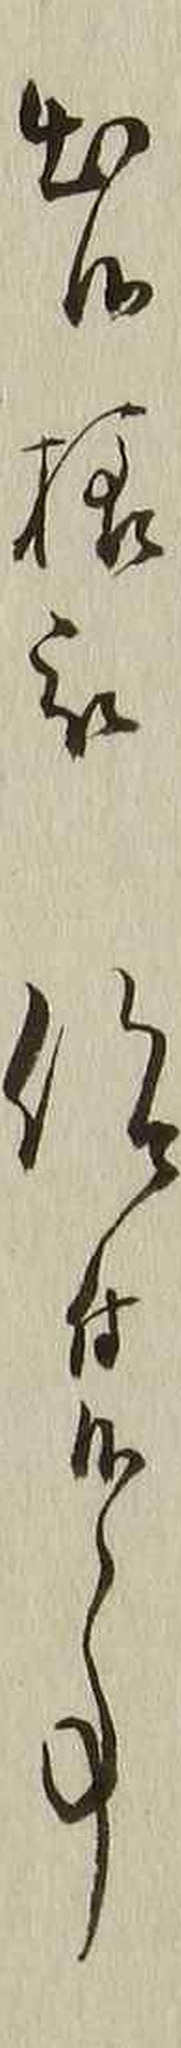出候様被仰付候事
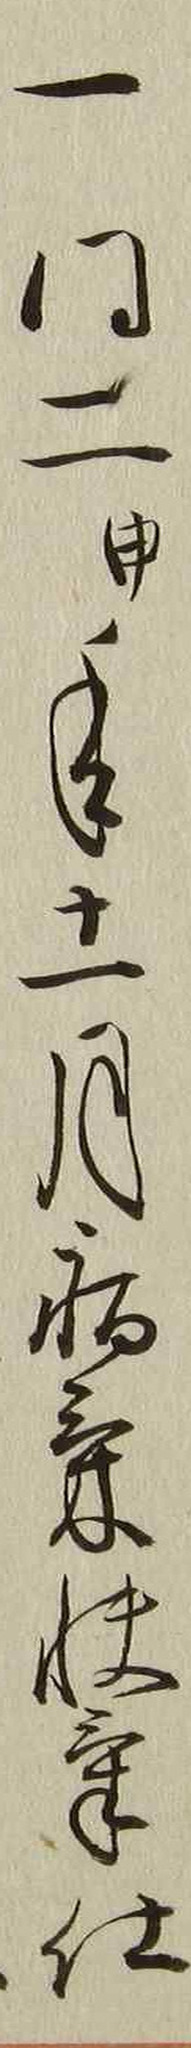一同二申年十一月病気快気仕
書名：諸士系譜　巻之57　ほ之部4
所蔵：会津若松市立会津図書館
